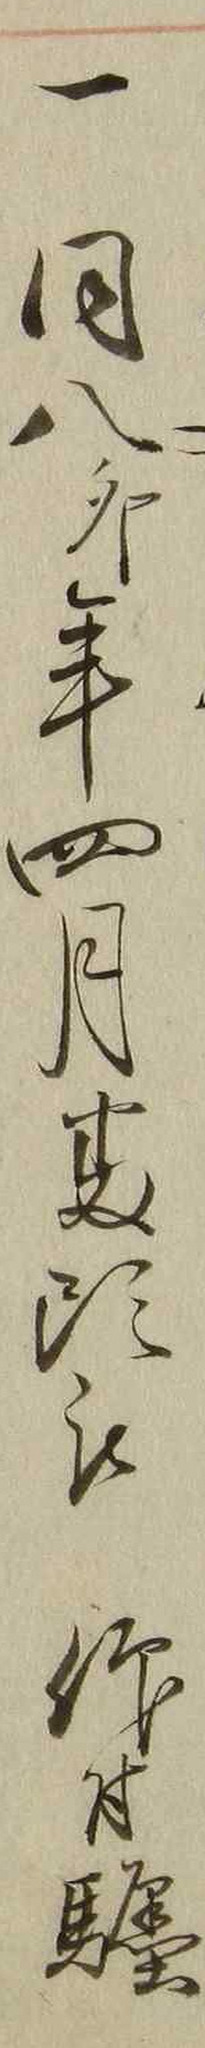一同八卯年四月番頭被仰付
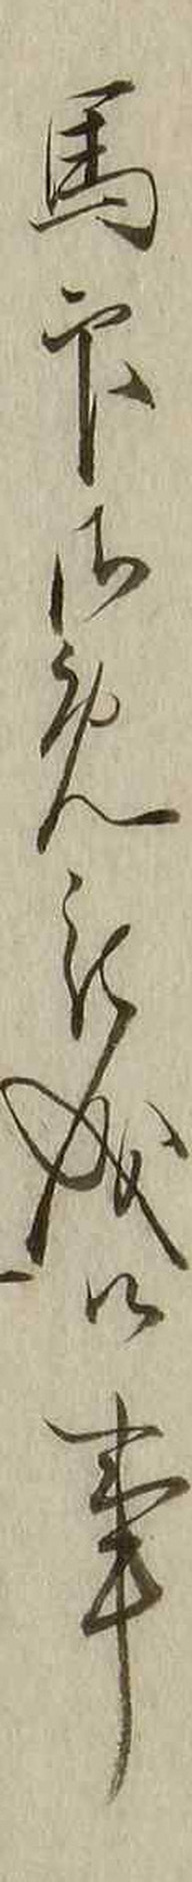馬印御免被成候事
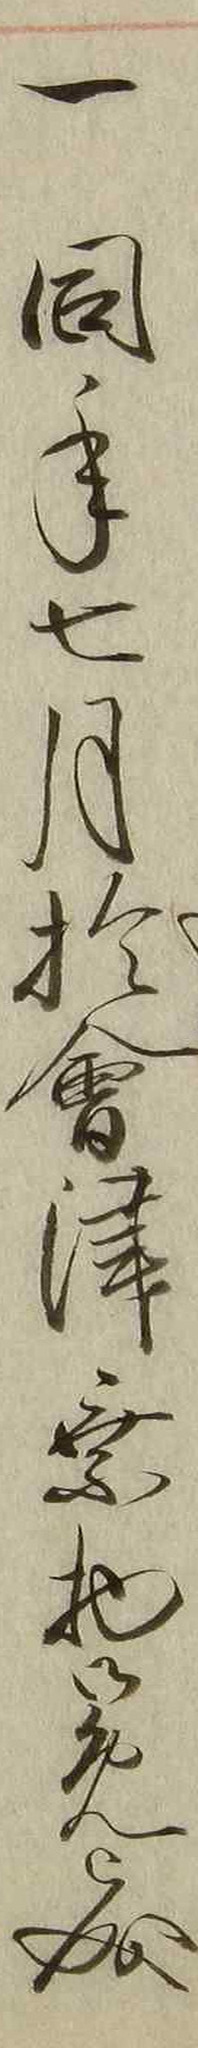一同年七月於会津乗物御免被成
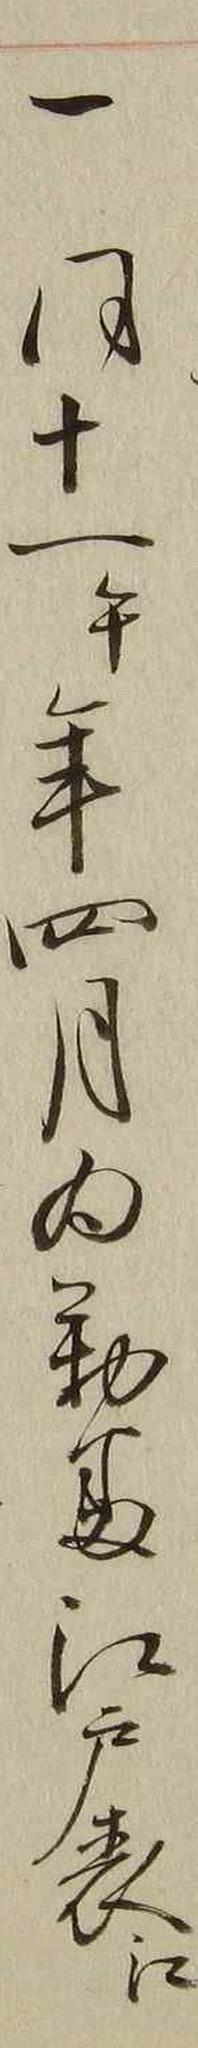一同十一午年四月為勤番江戸表江
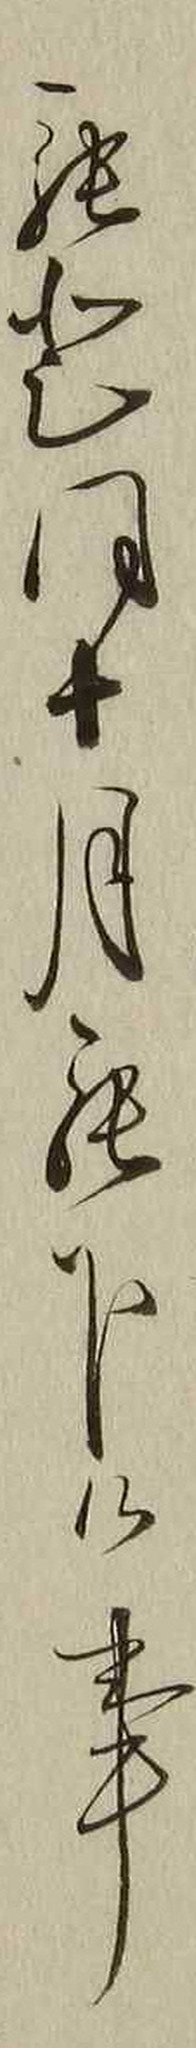罷登同十月罷下候事
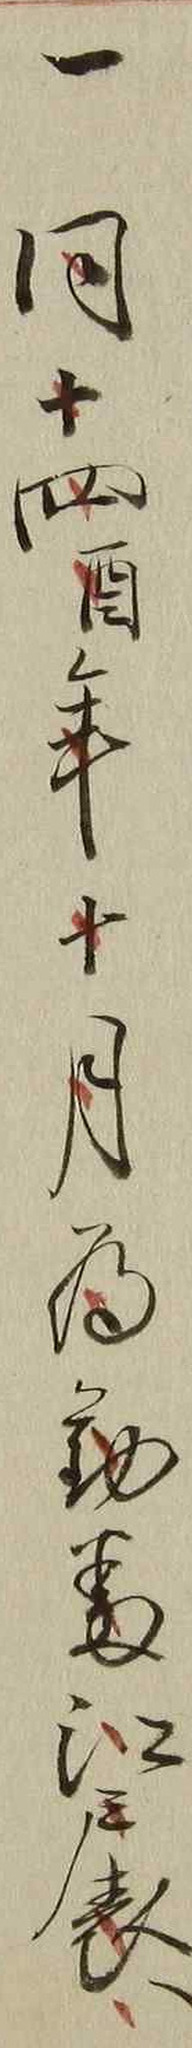一同十四酉年十月為勤番江戸表へ
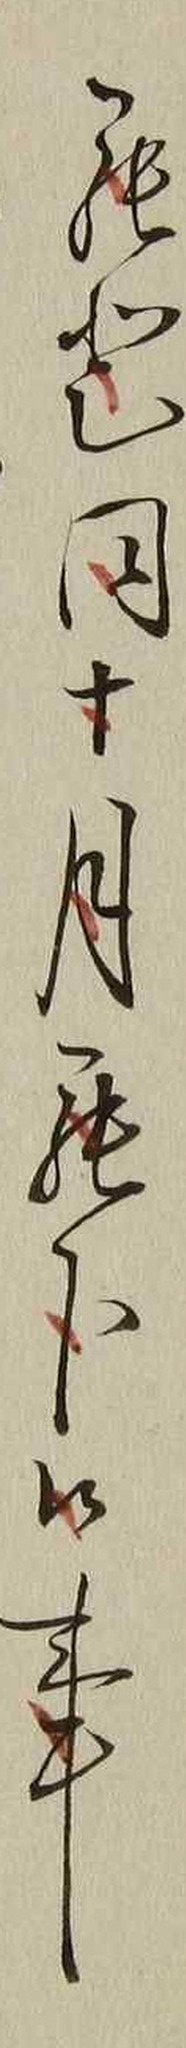罷登同十月罷下候事
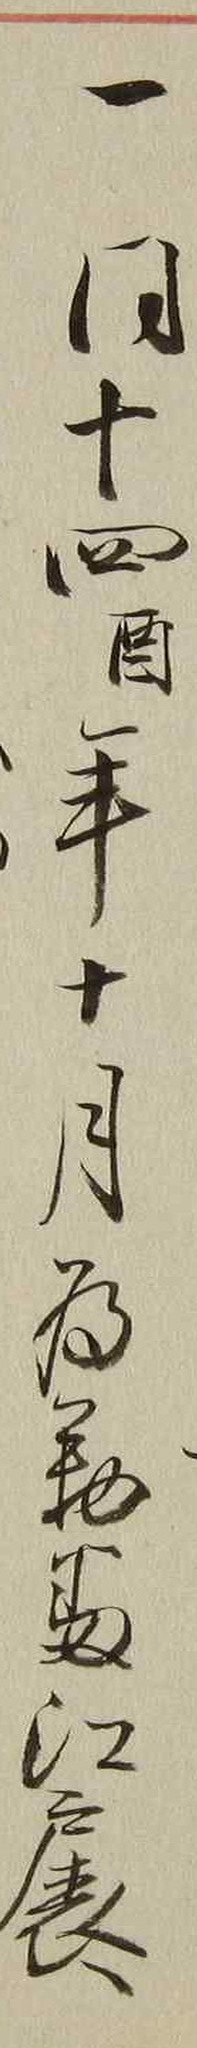一同十四酉年十月為勤番江戸表へ
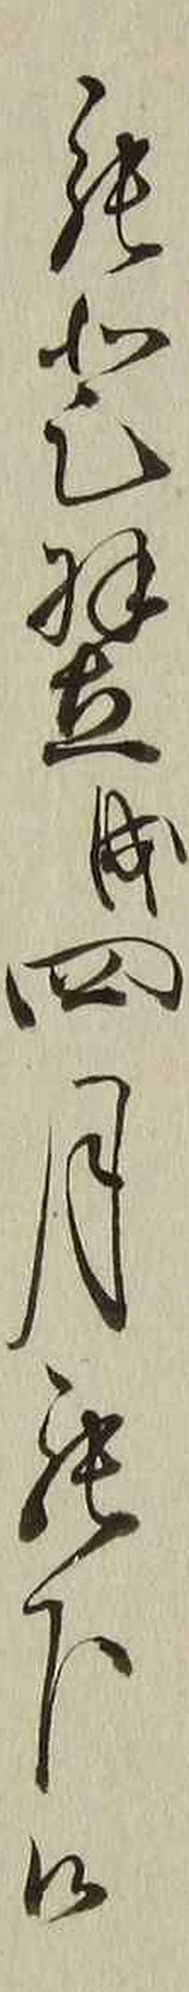罷登翌戌四月罷下候
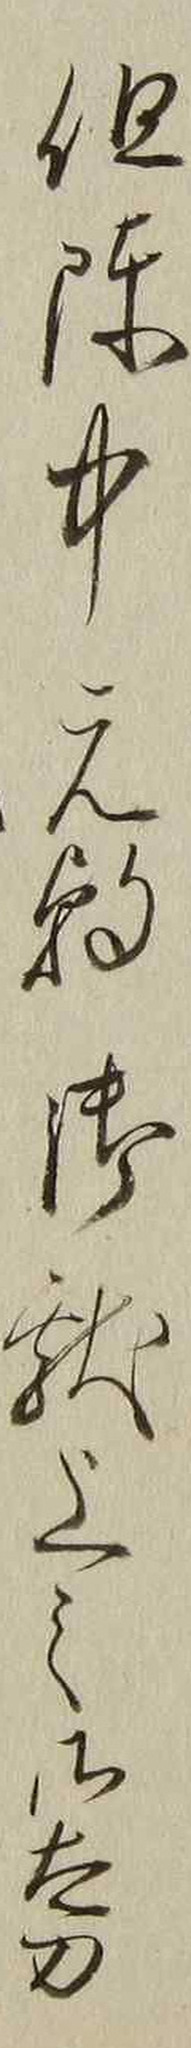但陣中元朝御献上之御太刀
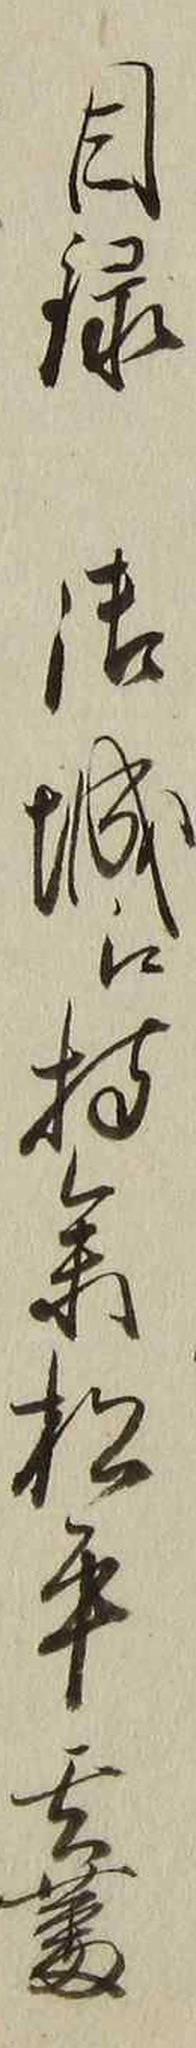目録御城江持参松平玄蕃
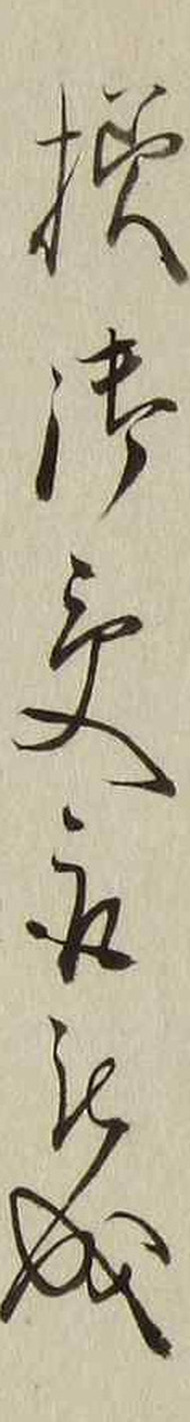様御受取被成
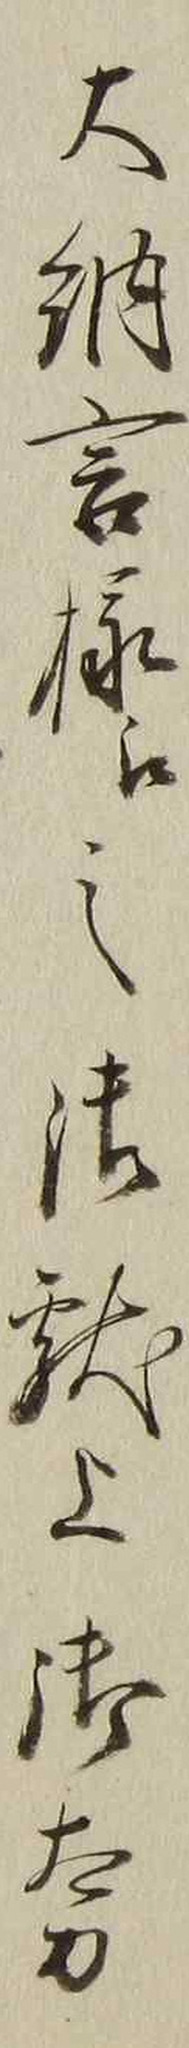大納言様江之御献上御太刀
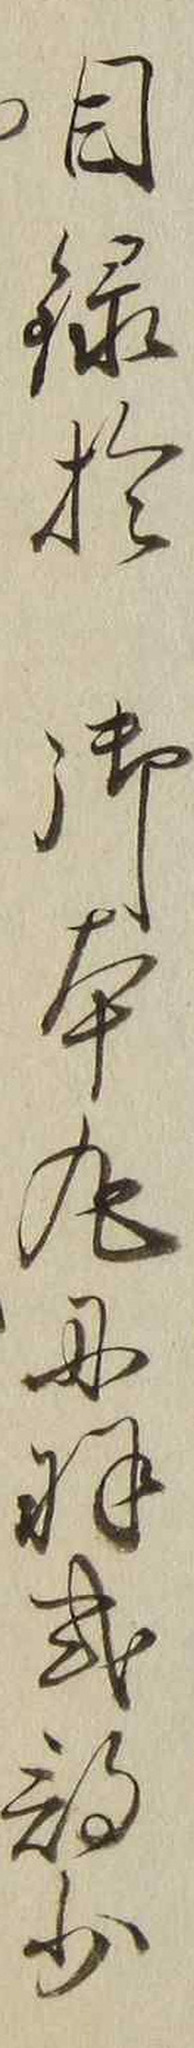目録於御本丸丹羽式部少
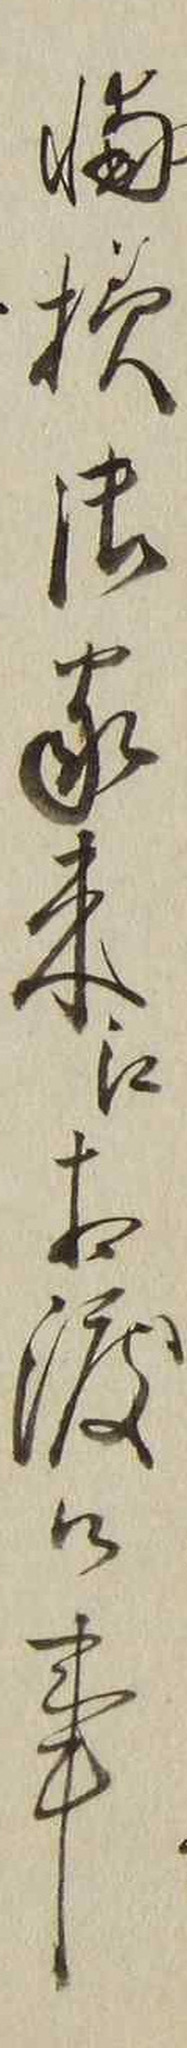輔様御家来江相渡候事
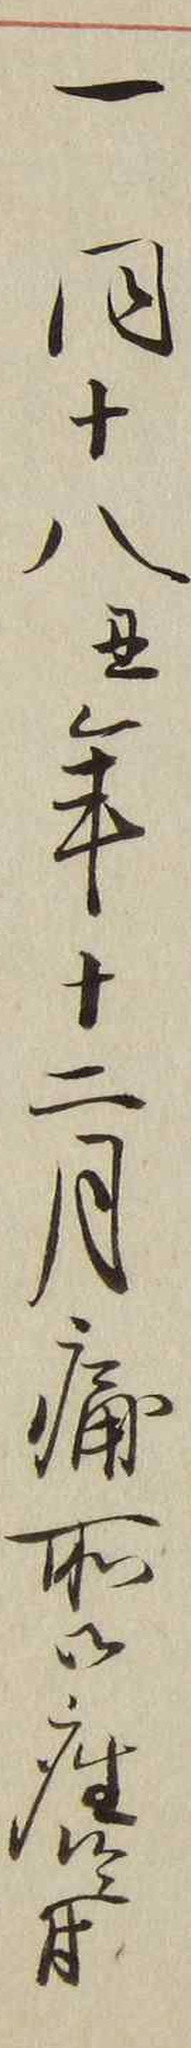一同十八丑年十二月痛所御座候に付
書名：諸士系譜　巻之103　か之部11
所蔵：会津若松市立会津図書館
